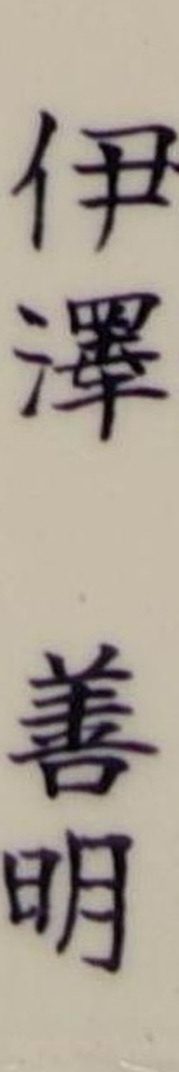伊澤善明
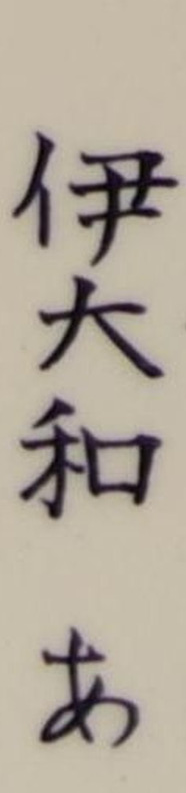伊大和あい
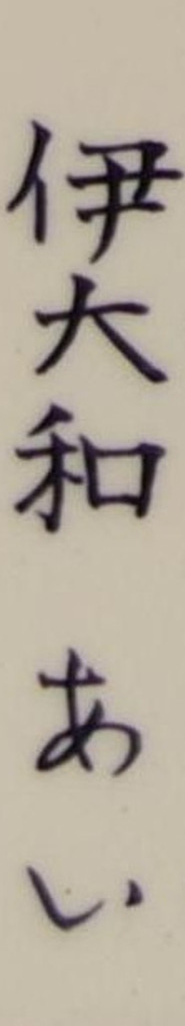伊大和あい
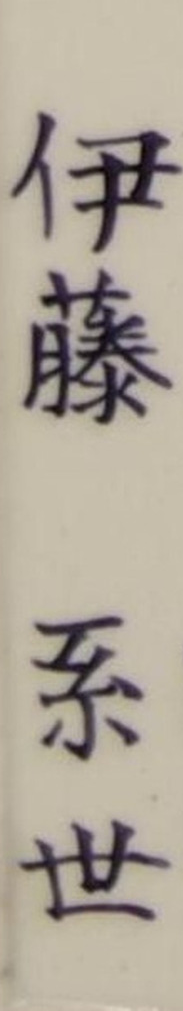伊藤系世

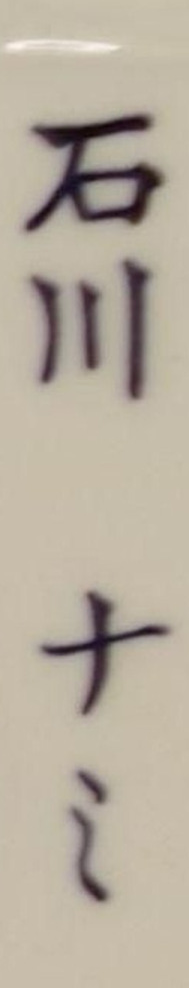石川ナミ
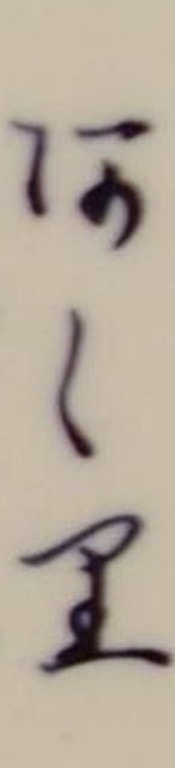あくり
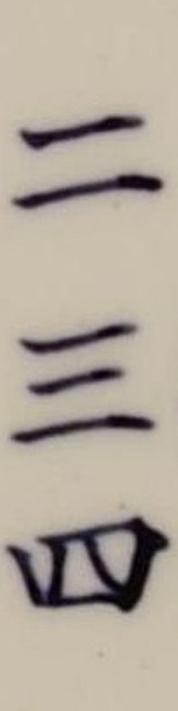二三四
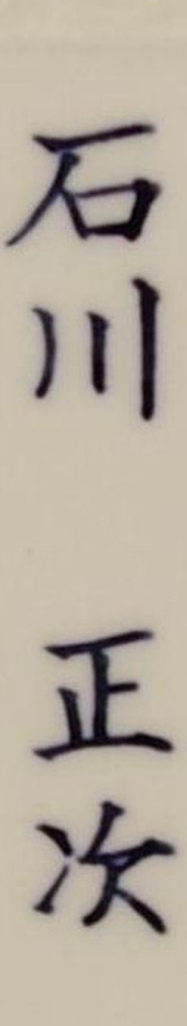石川正次
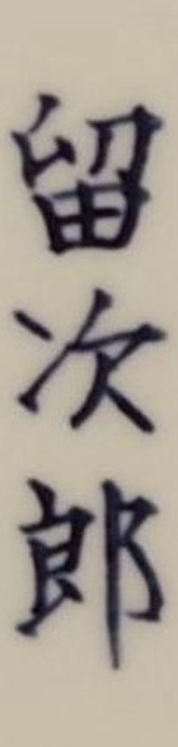留次郎
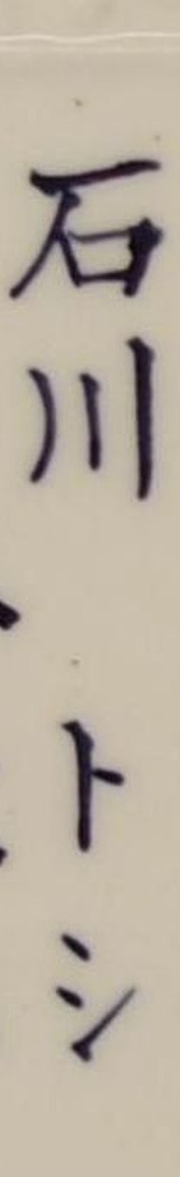石川トシ
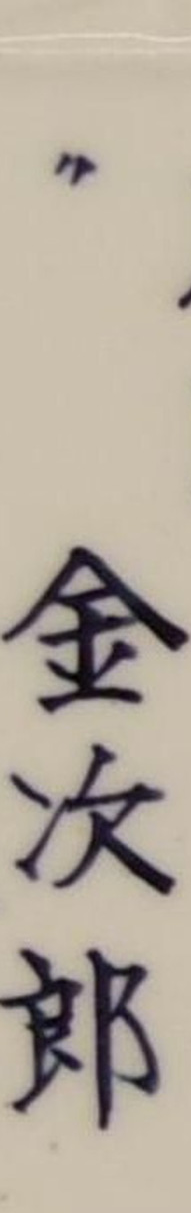金次郎
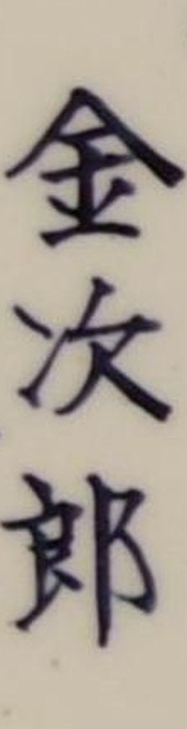金次郎
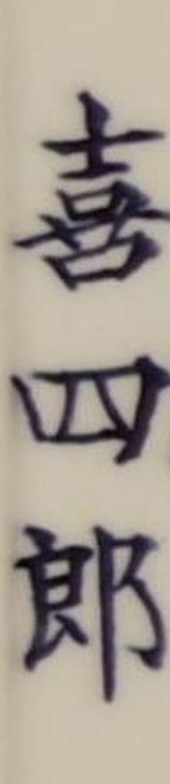喜四郎

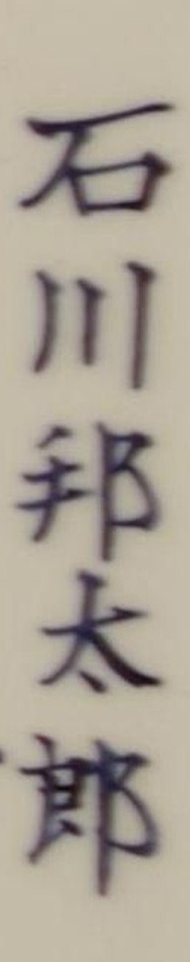石川邦太郎
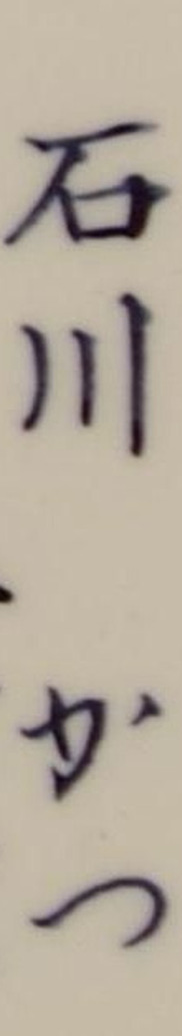石川かつ
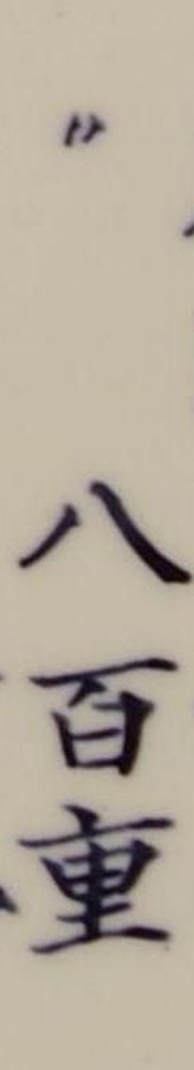八百重
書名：M~S
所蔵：高野山金剛峯寺
